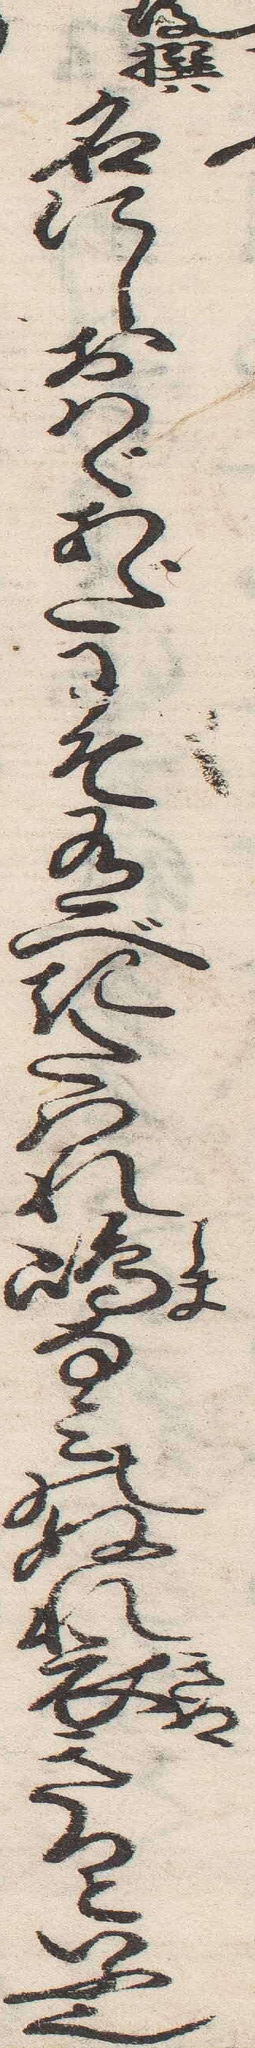後撰名にしおはゞあだにそ有べきたはれ島なみのぬれ衣きるといふ也
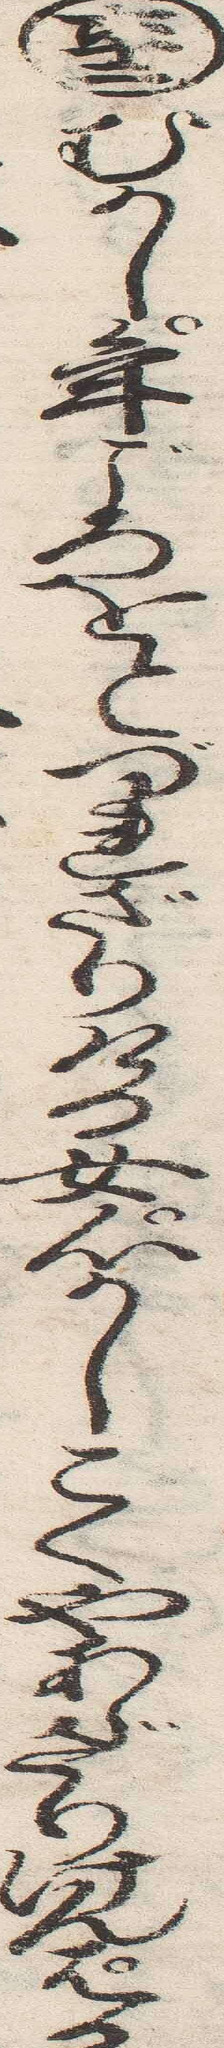六十二むかし。年ごろをとづれざりける女。心かしこくやあらざりけん。はか
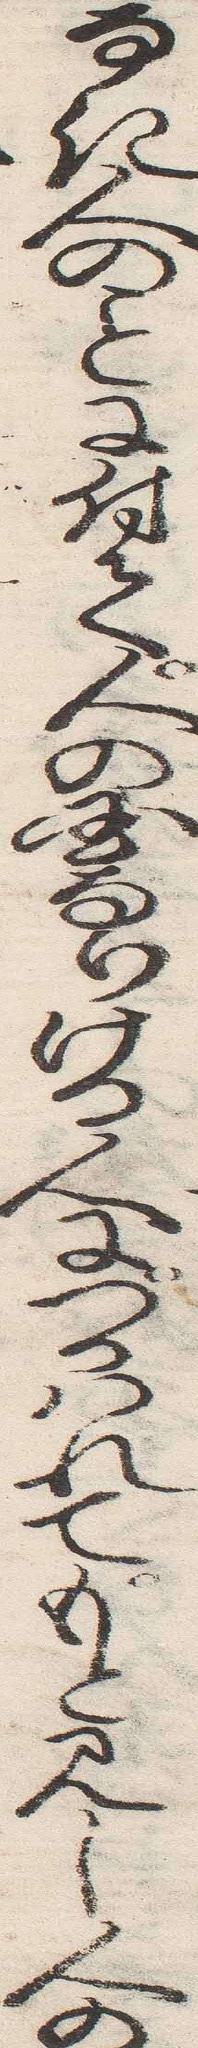なき人のことに付て。人の国なりける人に。つかはれて。もと見し人の
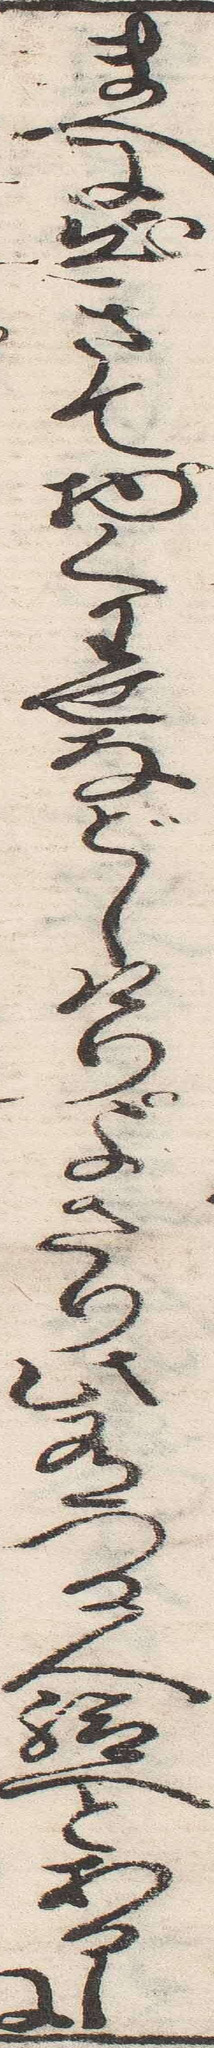まへに出きて。物くわせなどしけり。よさり此有つる人給へとあるしに
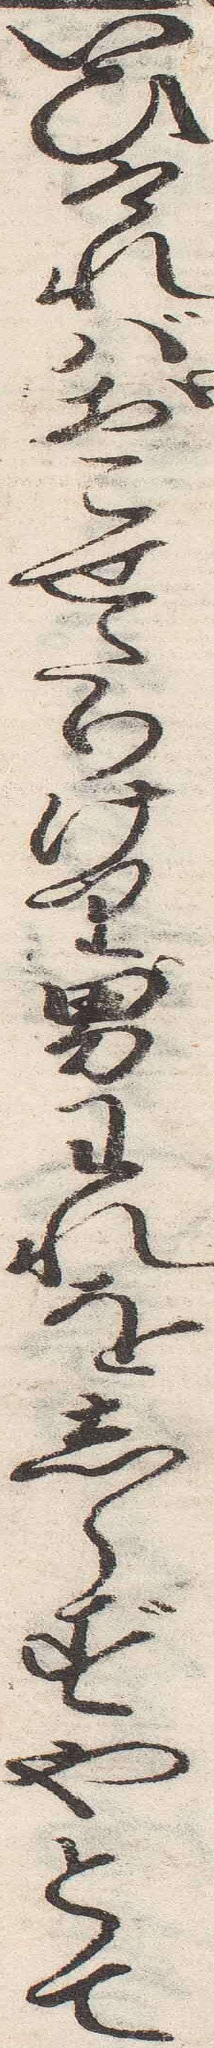いひければ。おこせたりけり。男われをしらずやとて
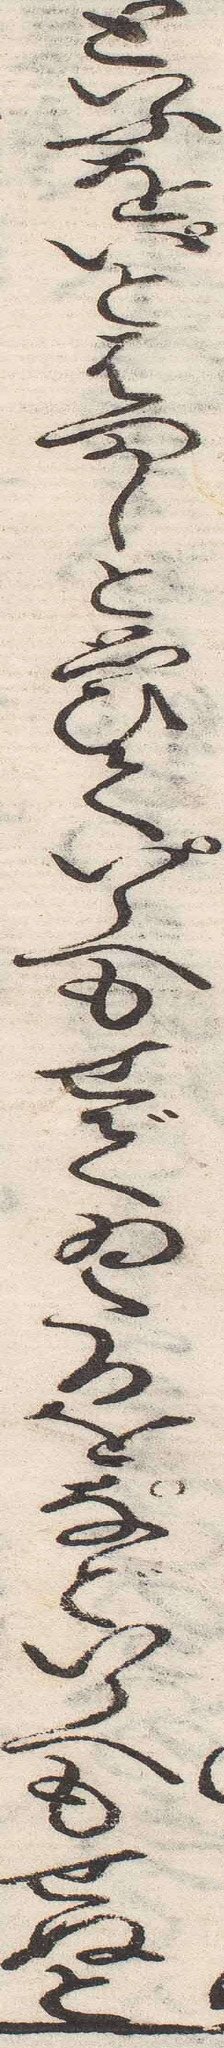といふを。いとはつかしと思ひて。いらへもせでゐたるを。などいらへもせぬと
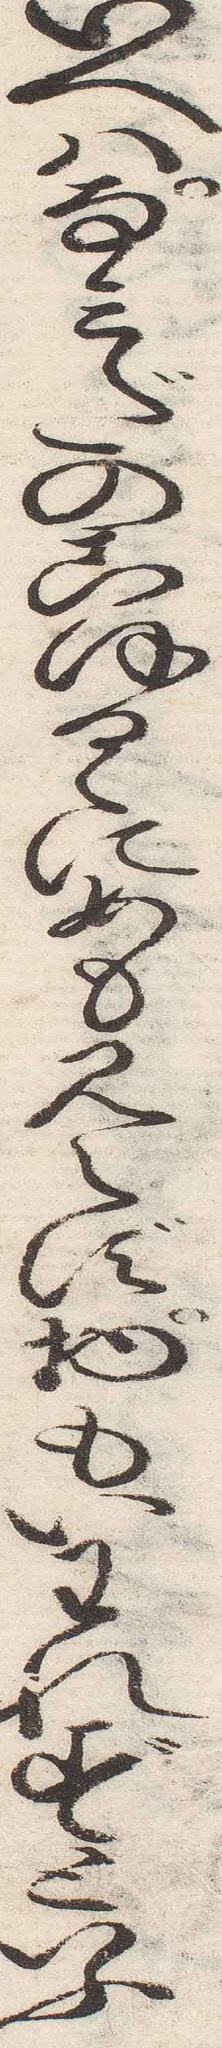いへは。なみだのこほるゝにめも見えず。物もいわれずといふ
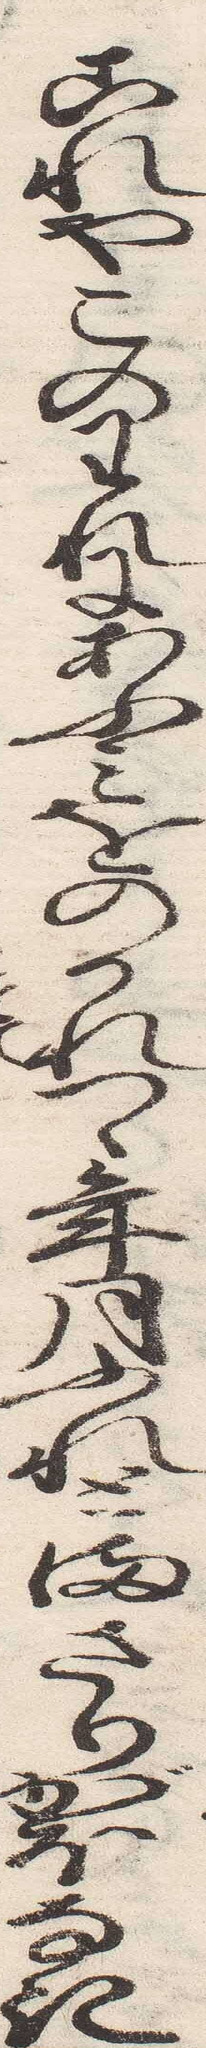これやこのわれにあふみをのかれつゝ年月ふれとまさりがほなき
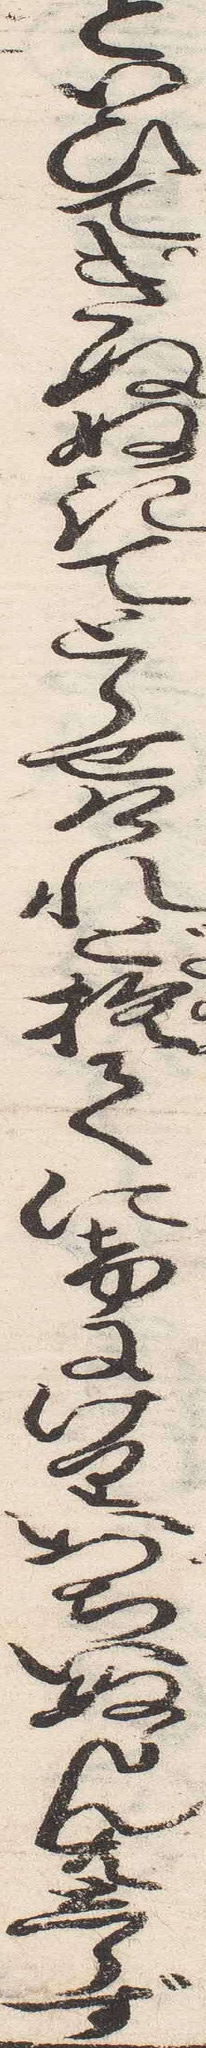といひて。きぬぬきてとらせけれど。捨てにけにけりいづちいぬらん共しらず

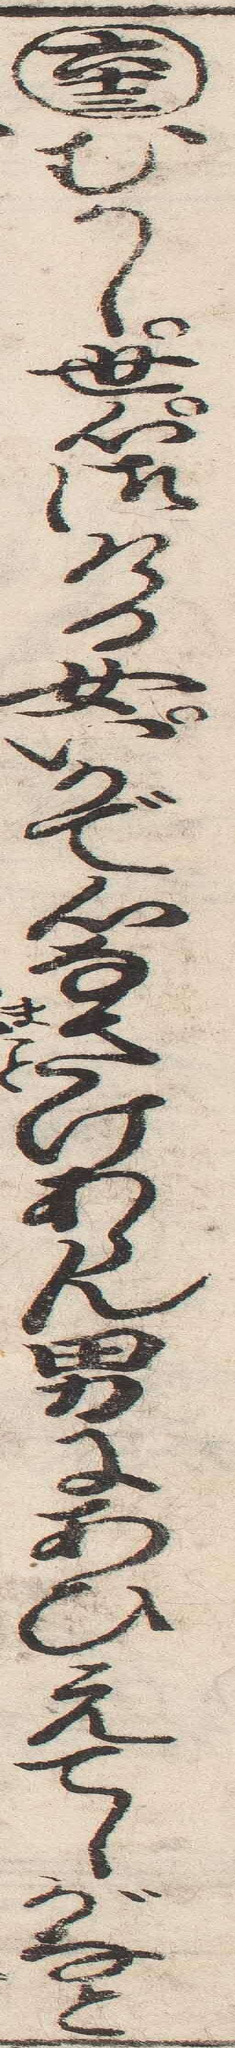六十三むかし。世。心つける女。いかで心なさけあらん男にあひえてしがなと
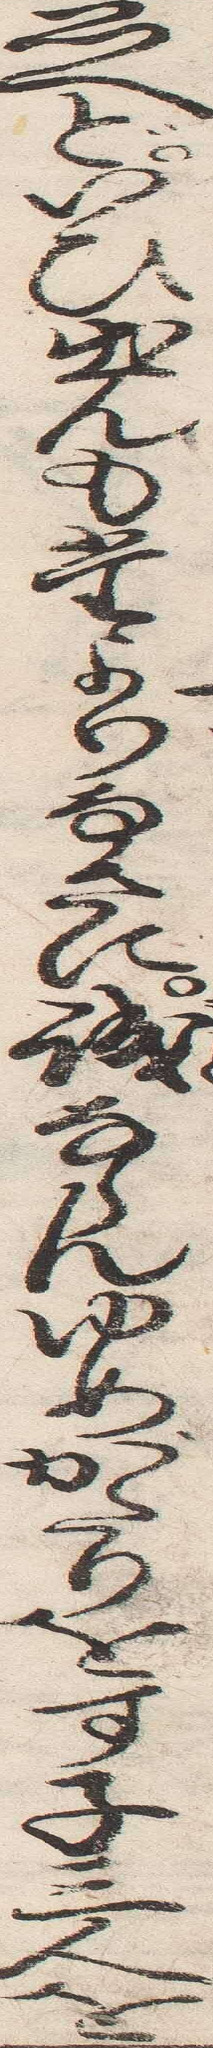思へど。いひ出んもたよりなさに。誠ならんゆめかたりをす子三人を
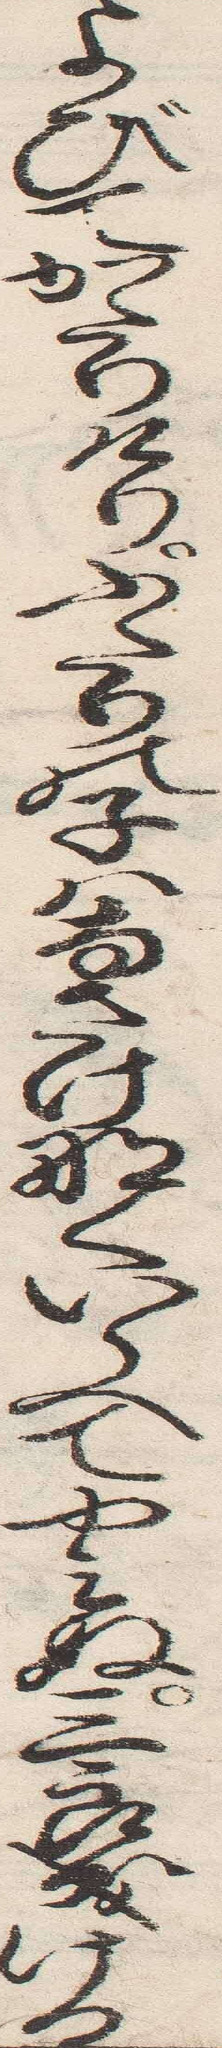よびてかたりけり。ふたりの子はなさけなくいらへてやみぬ。三郎成ける
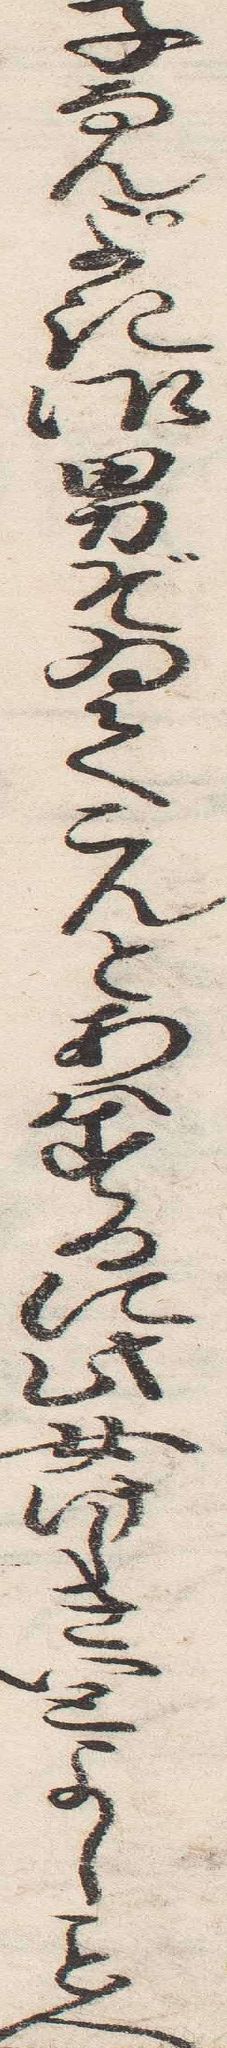子なん。よき御男ぞゐてこんとあはするに此女けしきいとよしこと人
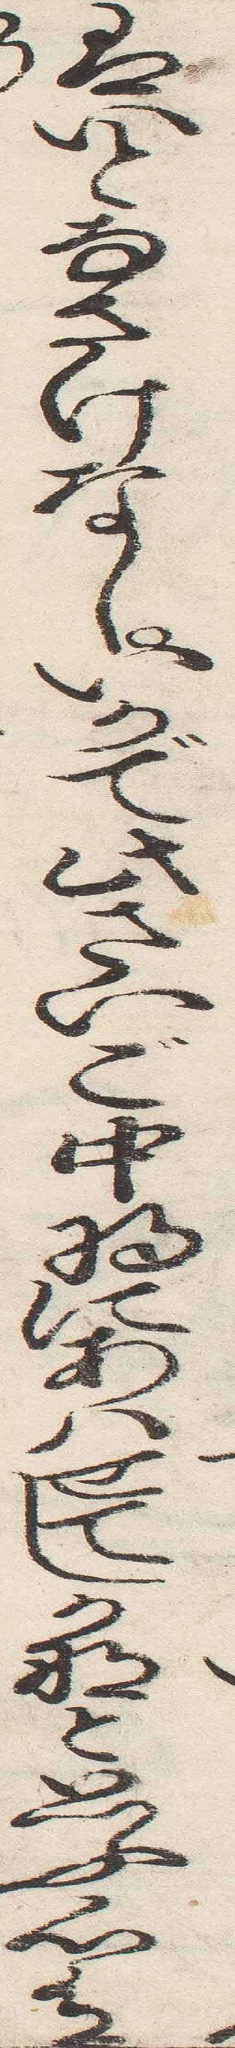はいとなさけなし。いかで此さいご中将にあはせてしかなと思ふ心有
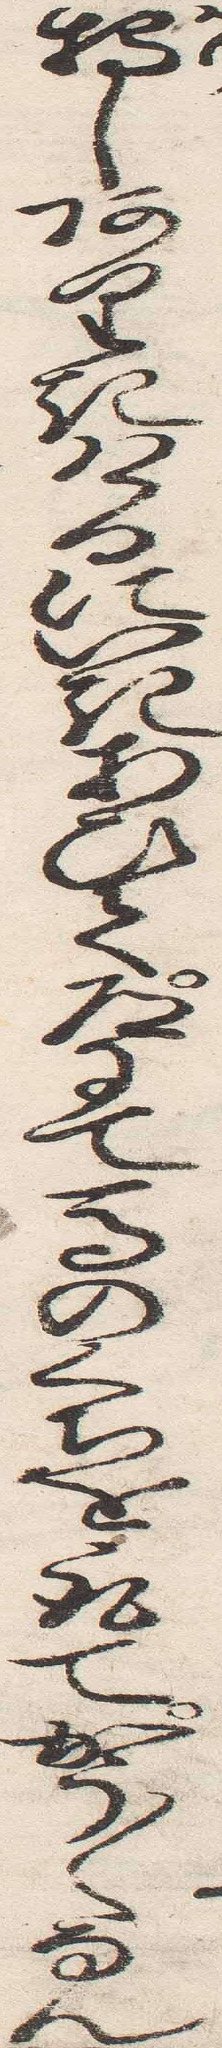狩しありきけるにいきあひて。道にて馬のくちを取て。かう〳〵なん
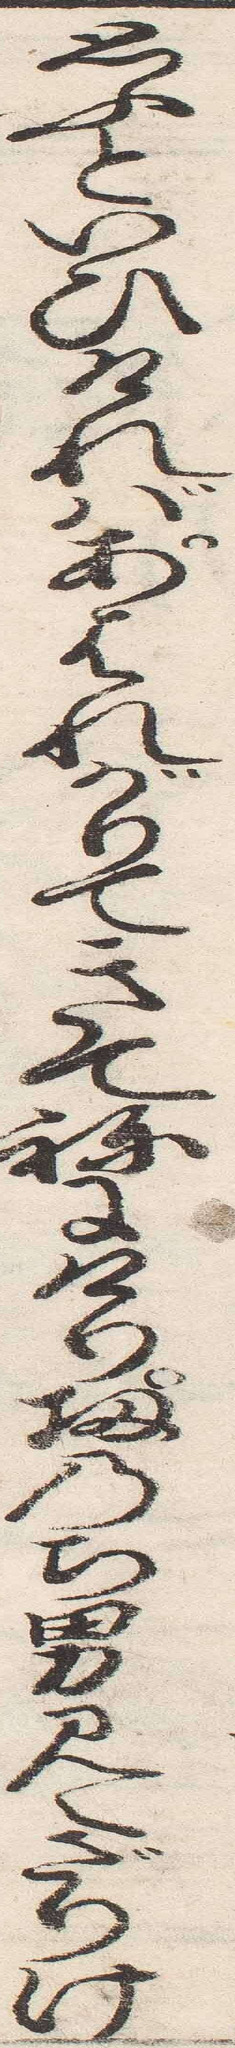思ふといひければ。あはれがりてきてねにけり。扨のち男見えざりけ
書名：伊勢物語
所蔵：東京学芸大学附属図書館 国文学研究資料館
